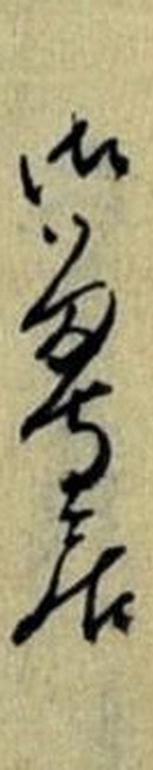御留守居
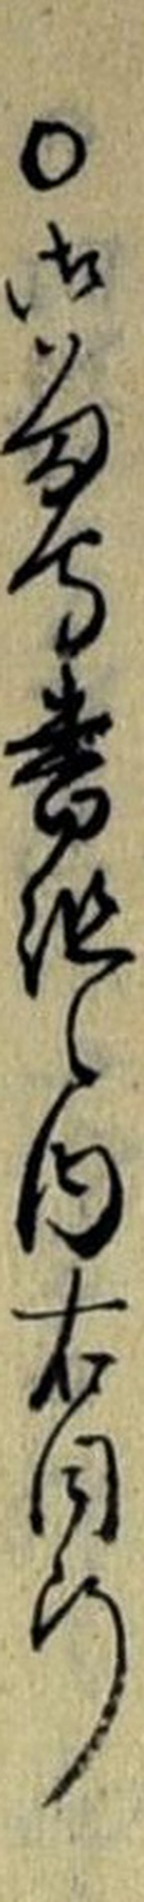○御留守番組之内右同断
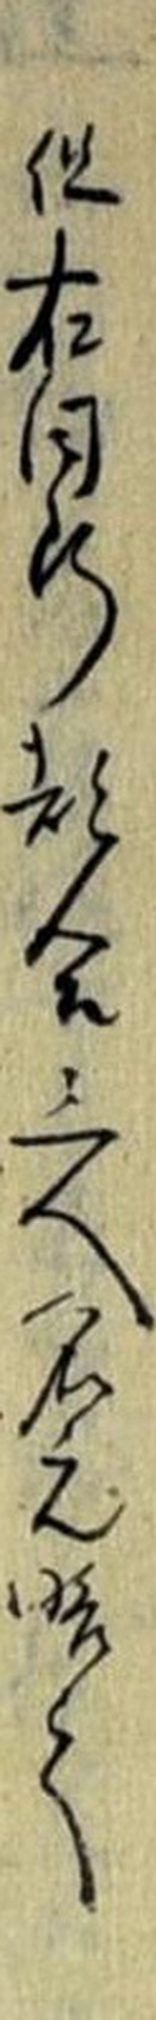但右同断都合三人名元略之
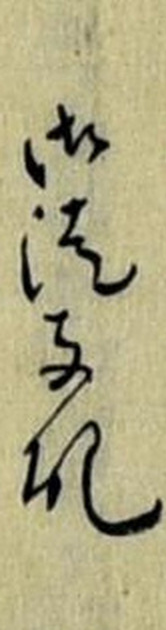御徒支配
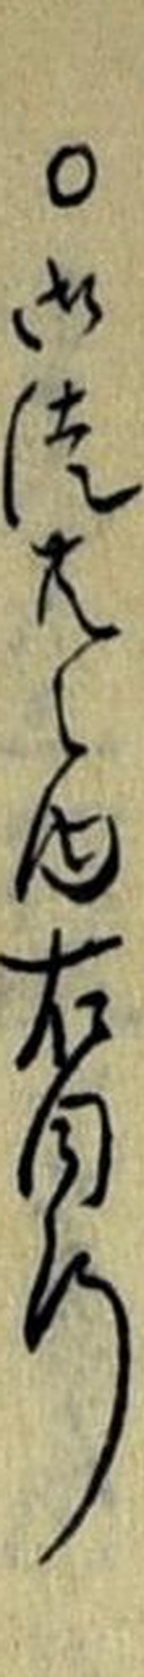○御徒共之内右同断
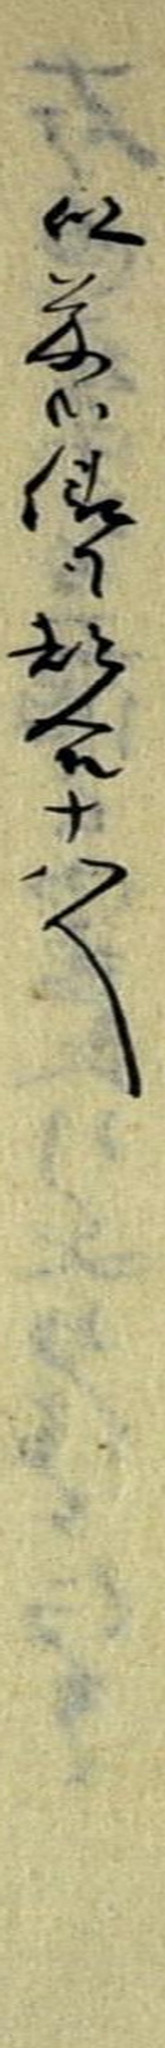但米弐俵つヽ都合十八人
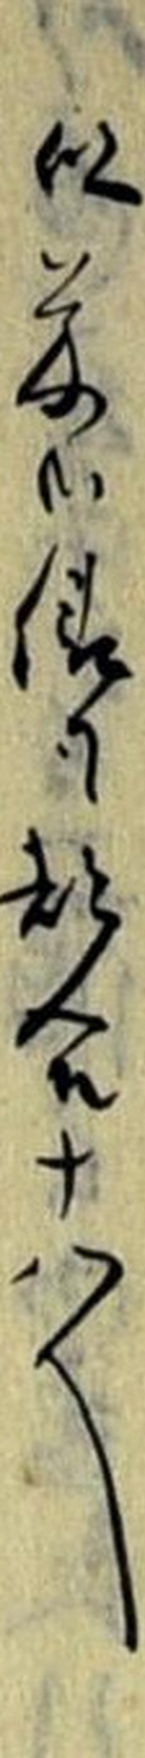但米弐俵つヽ都合十八人
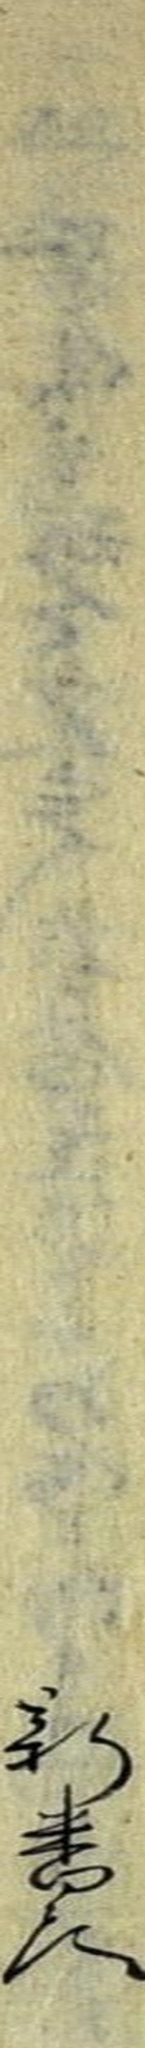新番頭
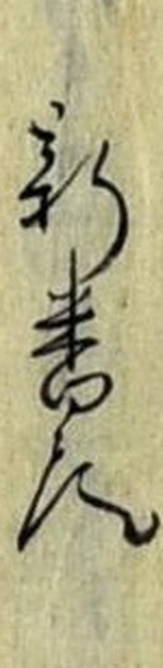新番頭
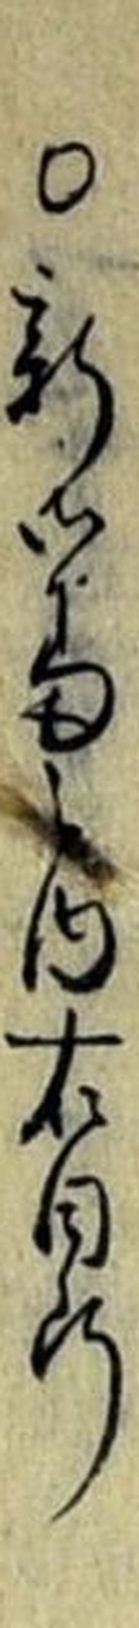○新御番之内右同断
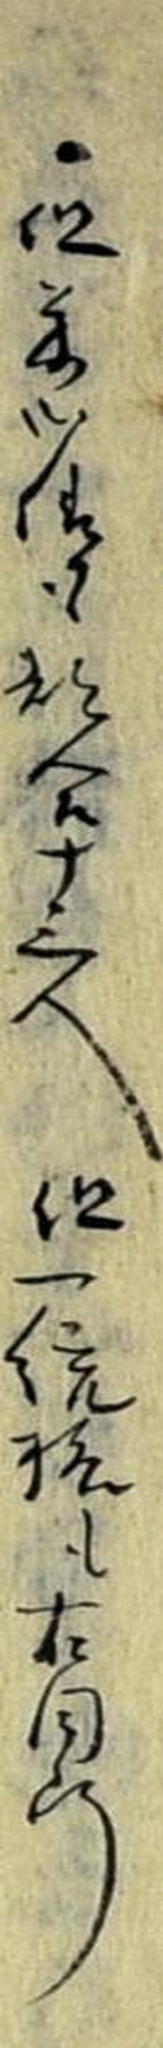但米弐俵つヽ都合十三人但一統格も右同断
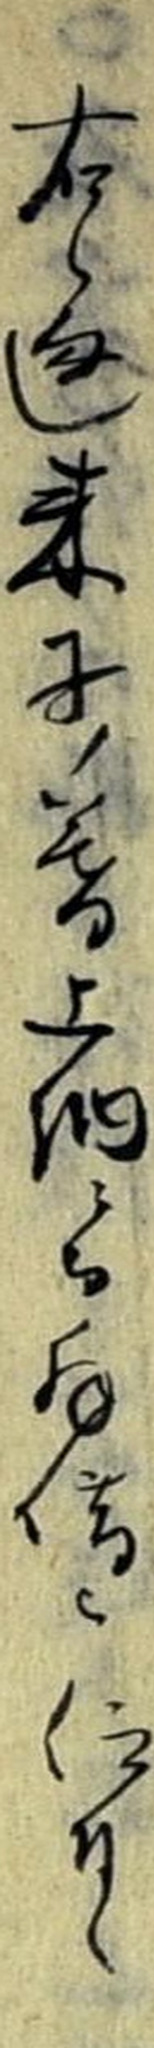右之通来子ノ暮上納に而拝借被仰付候
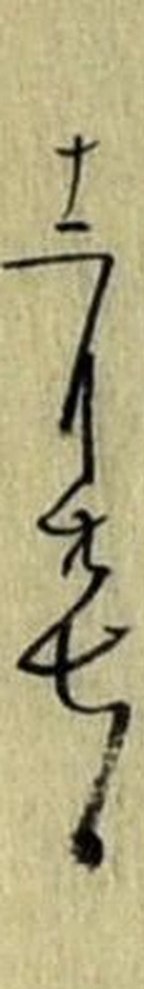十二月廿七日
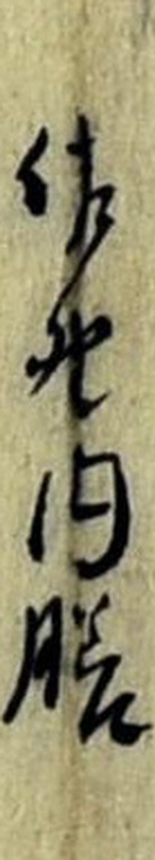佐野内膳
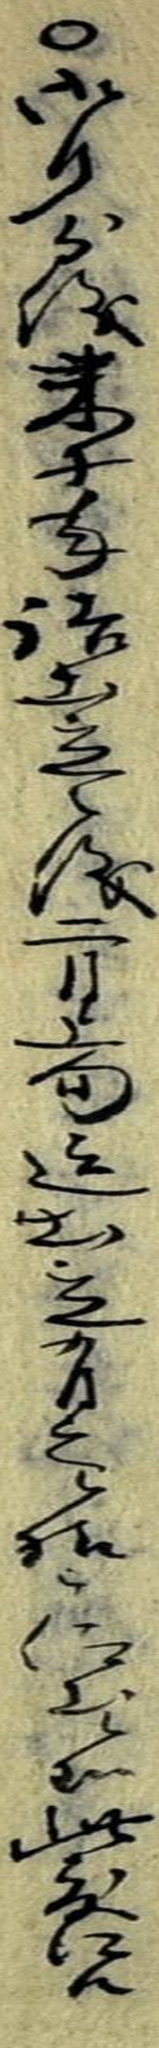○御自分儀来子年詰出立之儀二月上旬迄出立有之候様被仰出候処此度江口
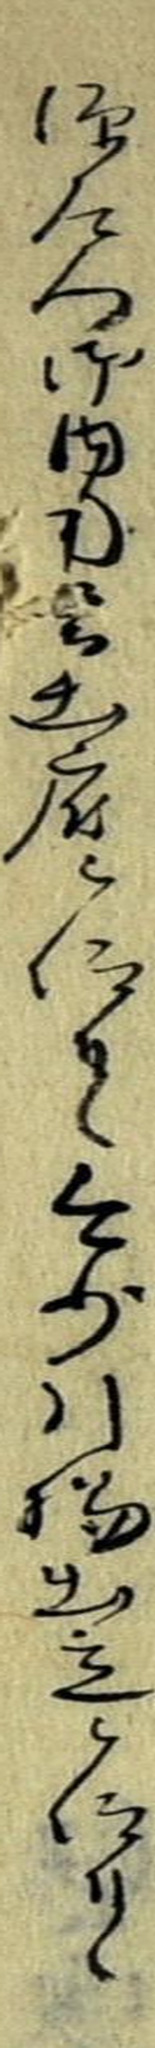源左衛門御内用に而出府被仰付候今少引暢出立被仰出候
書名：命令之部 四
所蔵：福井県文書館 Fukui Prefectural Archives
